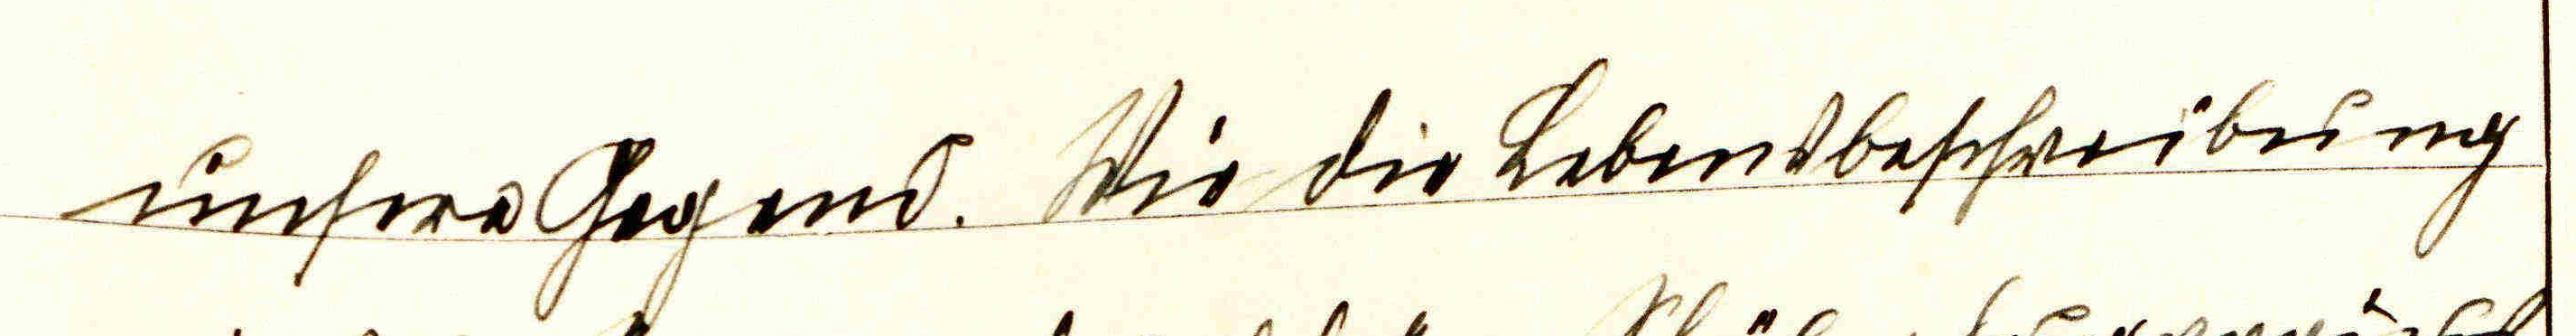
unsere Gegend. Wie die Lebensbeschreibung
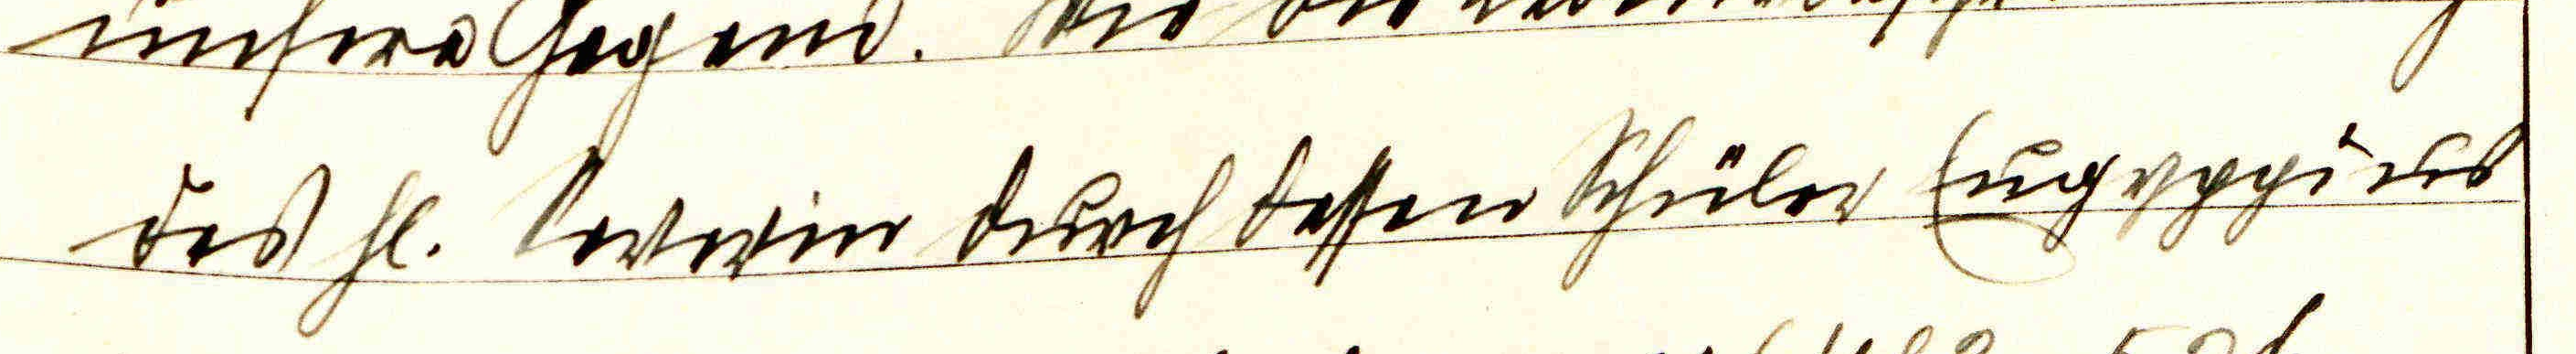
des Hl. Severin durch dessen Schüler Eugyggius
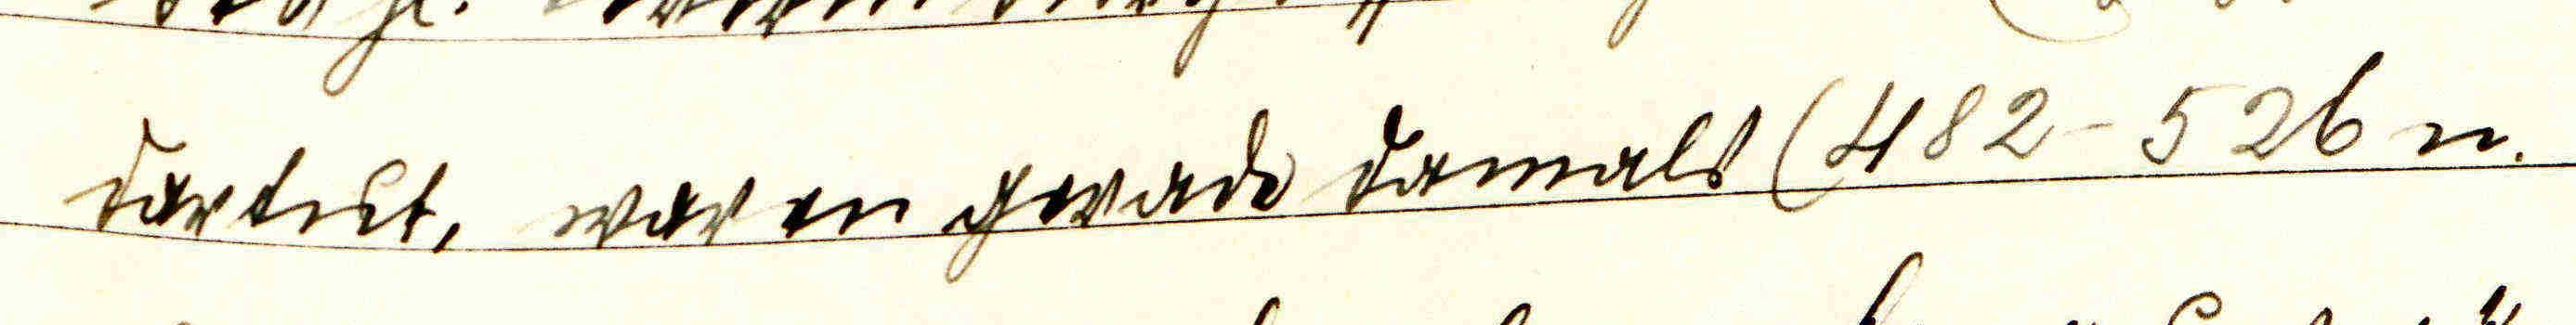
dartut, war an gerade damals (482-526 n.
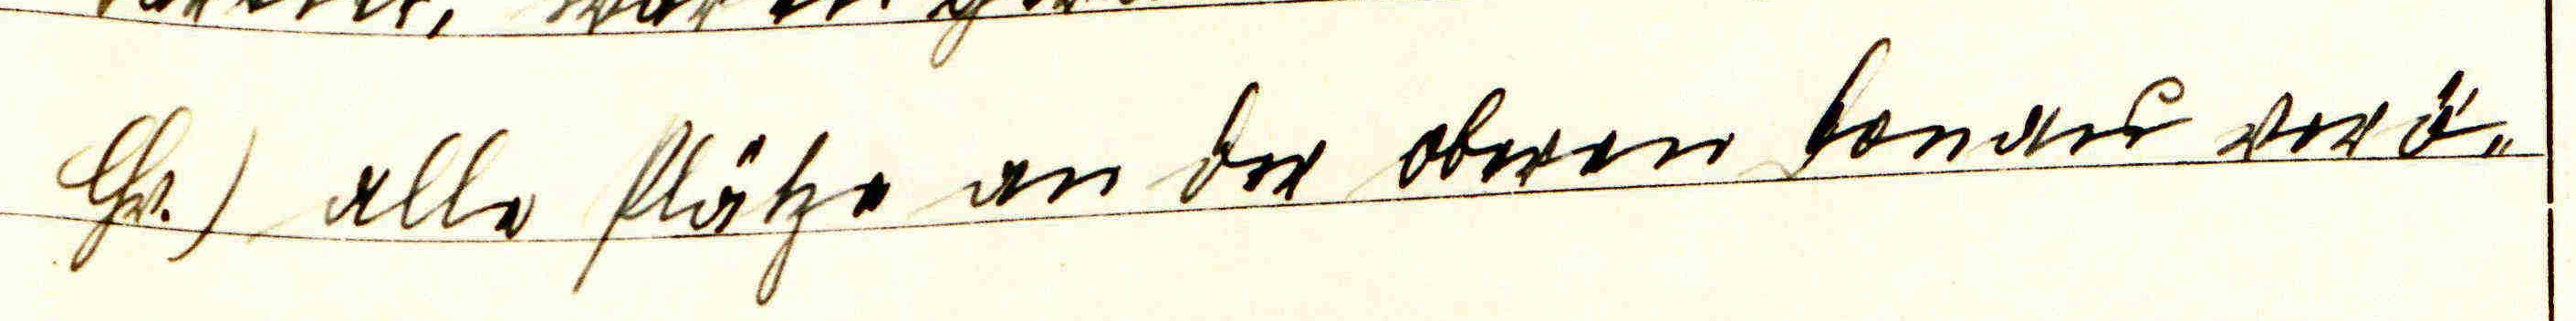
Chr.) all Plätze an der oberen Donau verö-
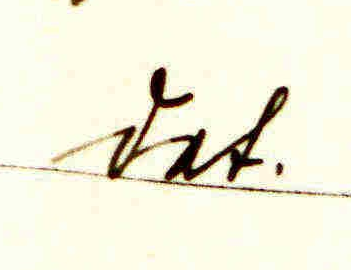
det.
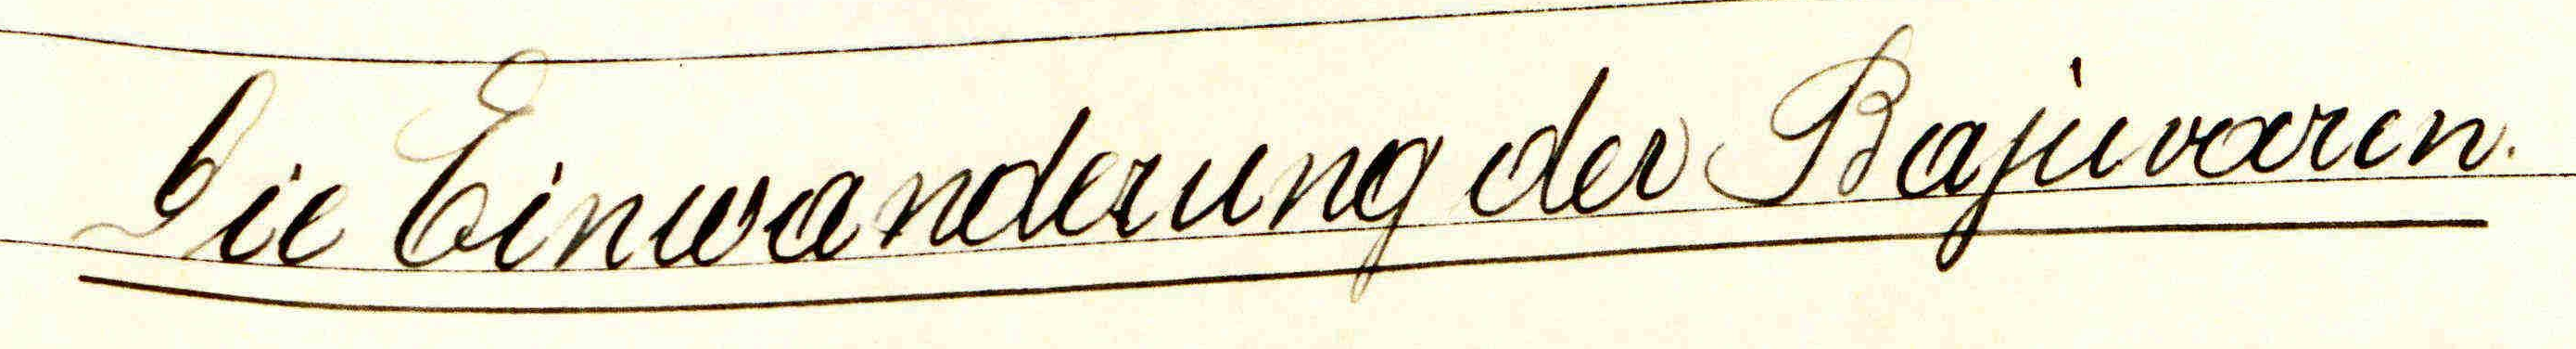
Die Einwanderung der Bajuwaren
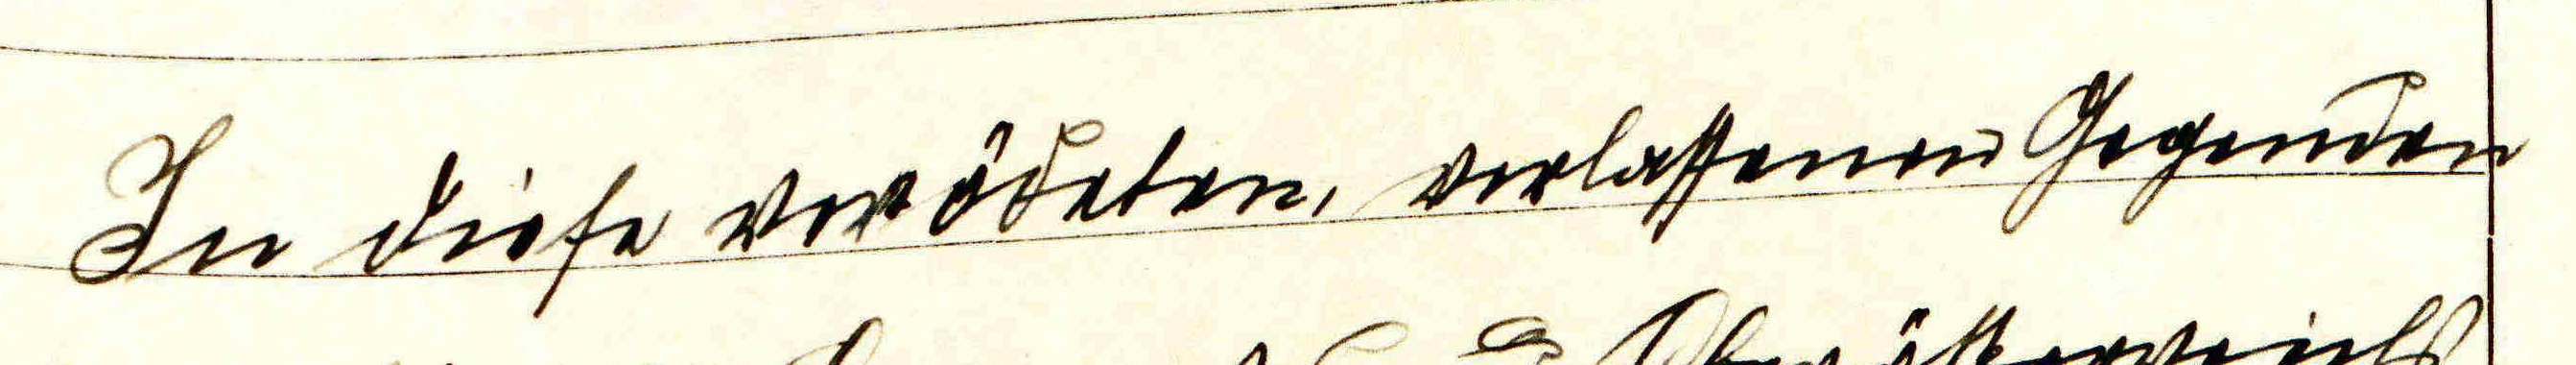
In diese verödeten, verlassenen Gegenden
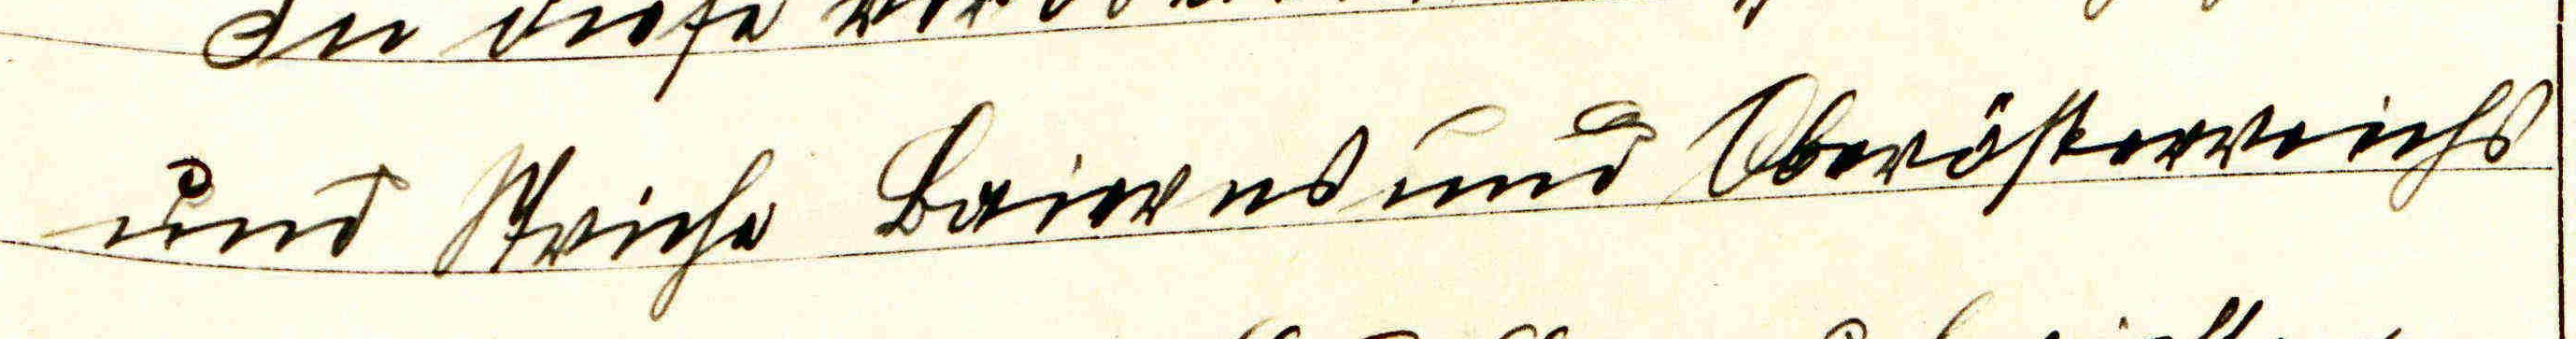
und Striche Baierns und Oberösterreichs
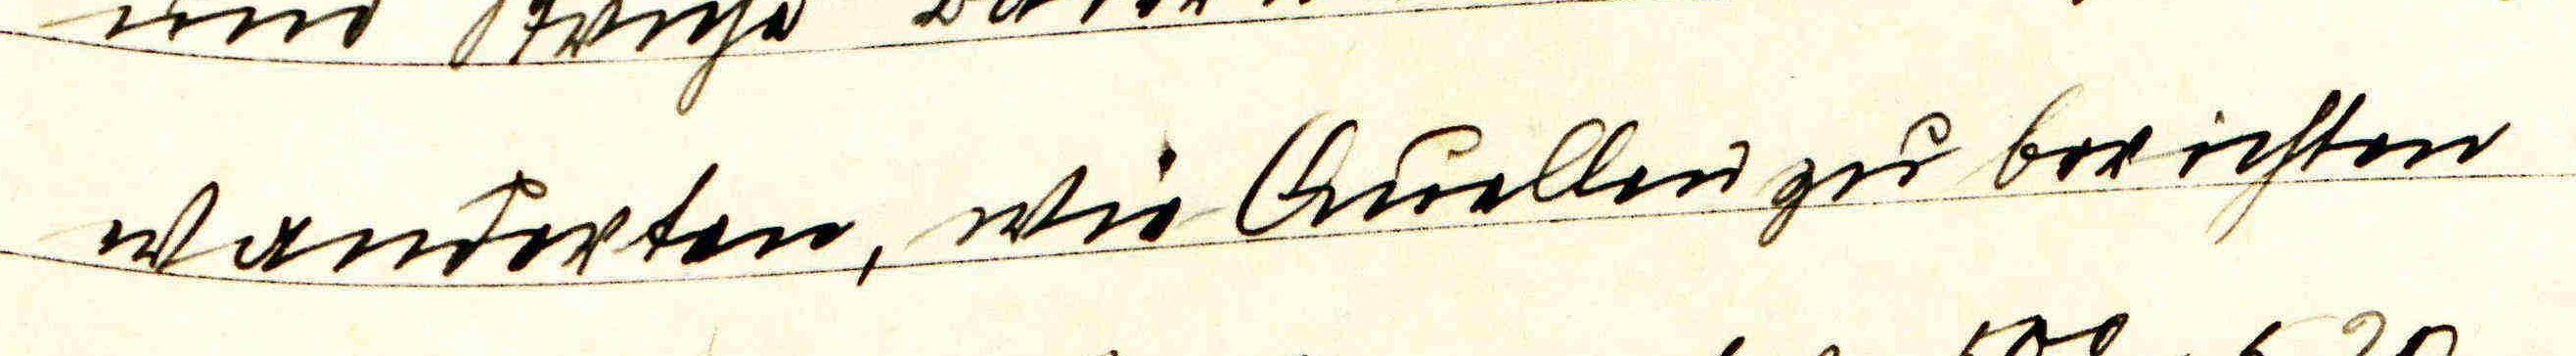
wanderten, wie Quellen zu berichten
